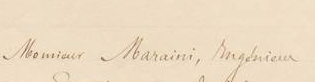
Monsieur Maraini, Ingénieur
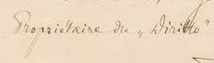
Propriétaire du «Diritto»
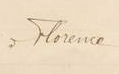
5. Via Magenta.
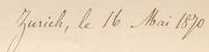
Zurich, le 16 Mai 1870
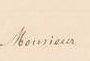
Monsieur
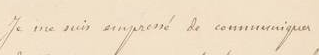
Je me suis empressé de communiquer
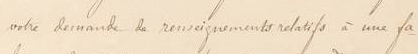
votre demande de renseignements relatifs à une fa-
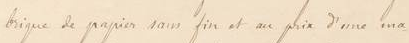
brique de papier sans fin et au prix d'une ma-
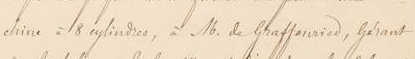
chine à 8 cylindres, à M. de Graffenried, Gérant
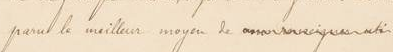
paru le meilleur moyen de vous renseigner uti
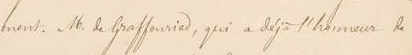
ment. M. de Graffenried, qui a déja l'honneur de
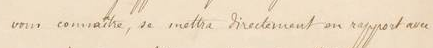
vous connaître, se mettra directement en rapport avec
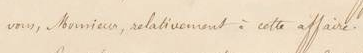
vous, Monsieur, relativement à cette affaire.
